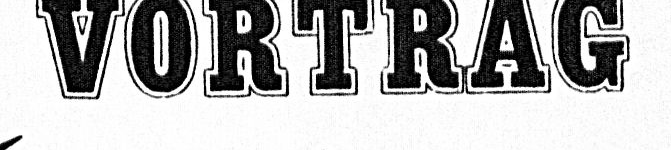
VORTRAG
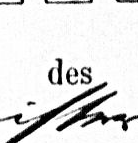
des
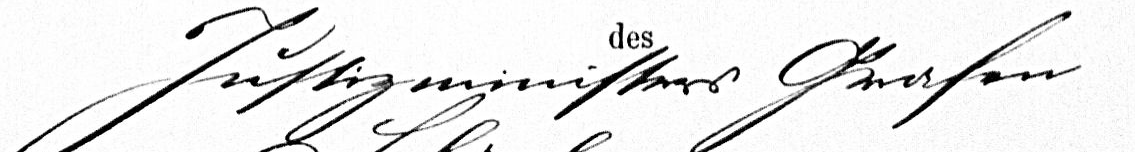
Justizminister Grafen
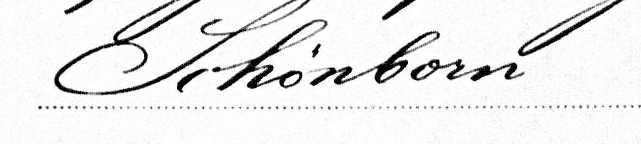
Schönborn
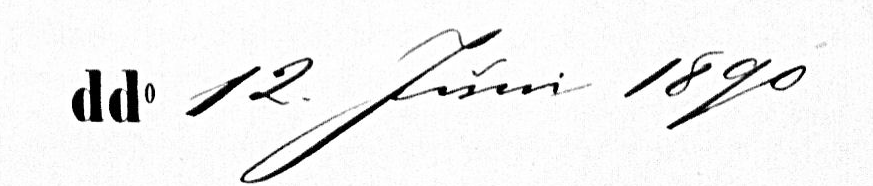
dd° 12. Juni 1890
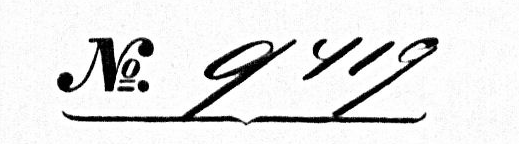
N° 9419
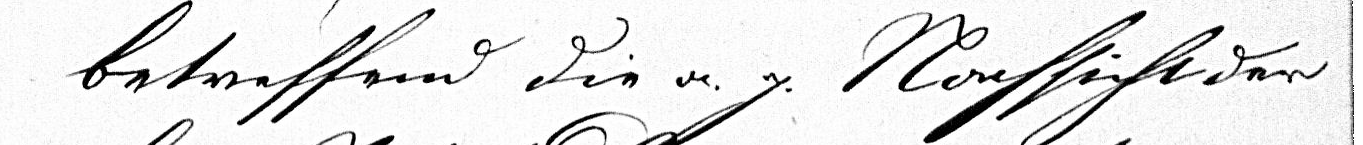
betreffen die a. g. Nachsicht der
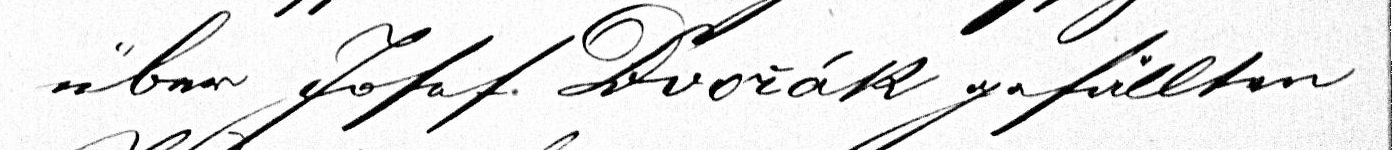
über Josef. Dvořák gefällten
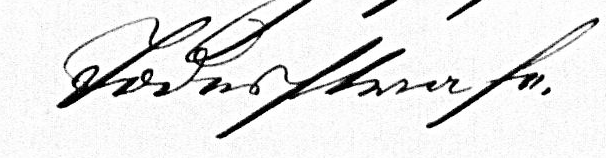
Todesstrafe.
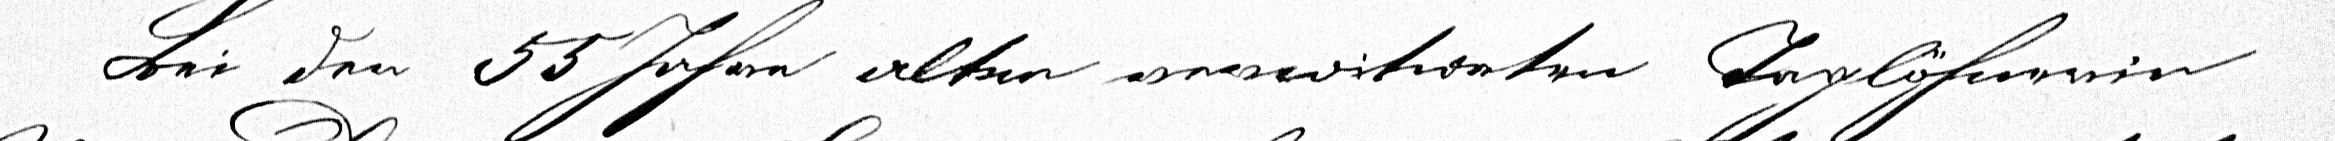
Bei den 55 Jahre alten verwitweten Taglöhnerin
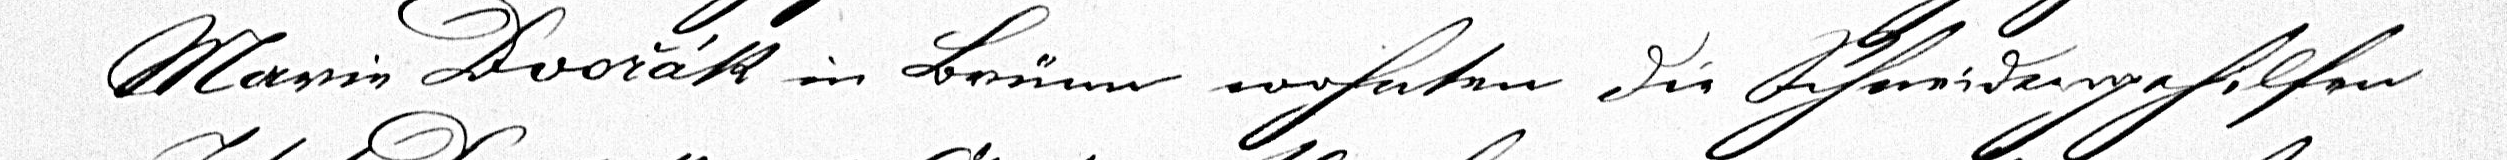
Marie Dvořák in Brünn wohnten die Schneidergehilfen
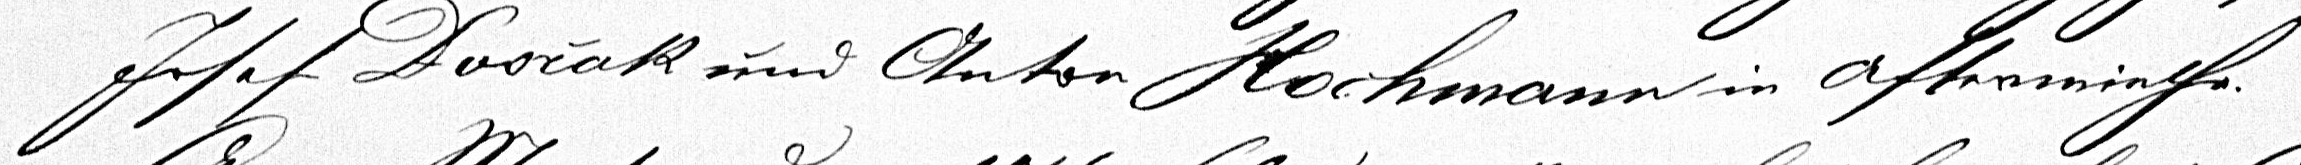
Josef Dvořák und Anton Hochmann in Osterwiethe.
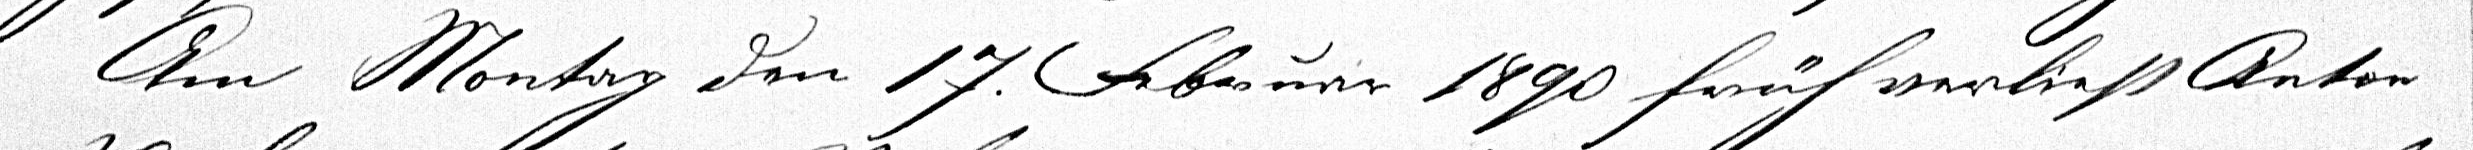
Am Montag den 17. Februar 1890 früh verließ Anton
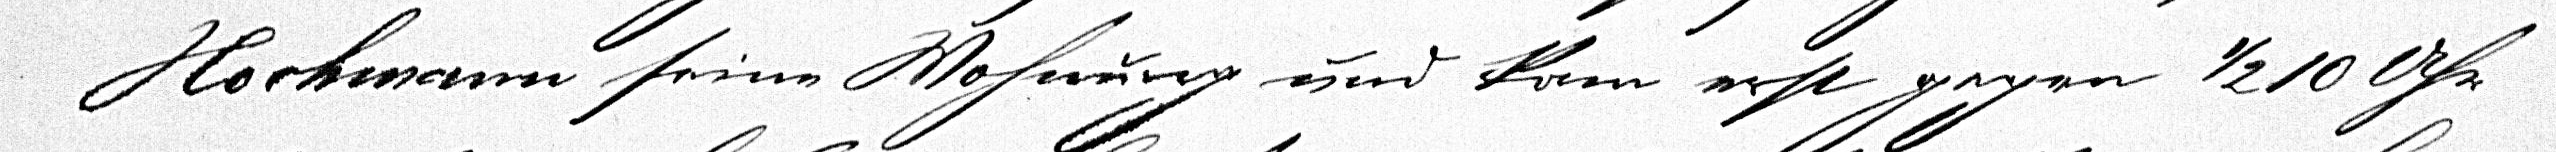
Hochmann seine Wohnung und kam erst gegen 1/2 10 Uhr
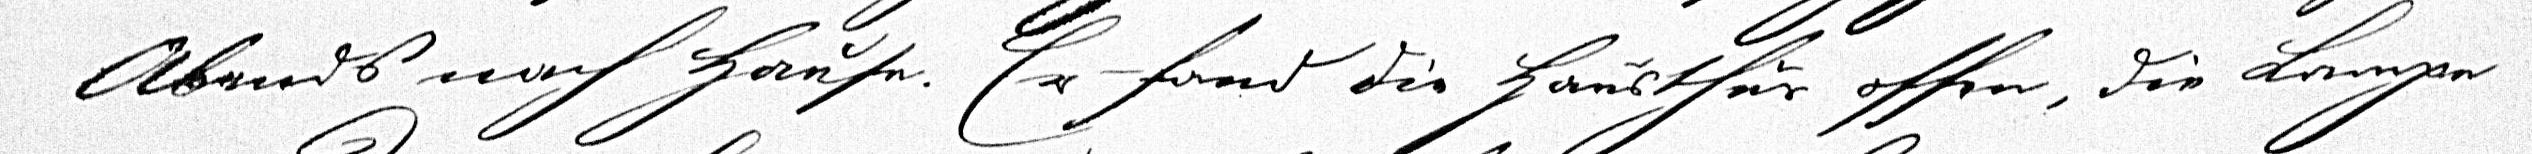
Abends nach Hause. Er fand die Hausthur offen, die Lange
